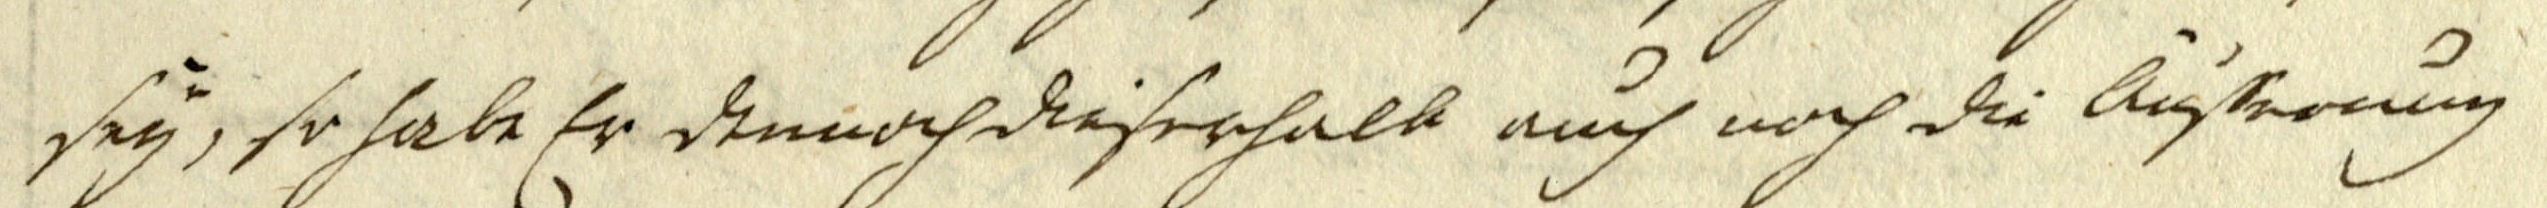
seÿ, so habe Er dennoch dieserhalb auch noch die Äusserung
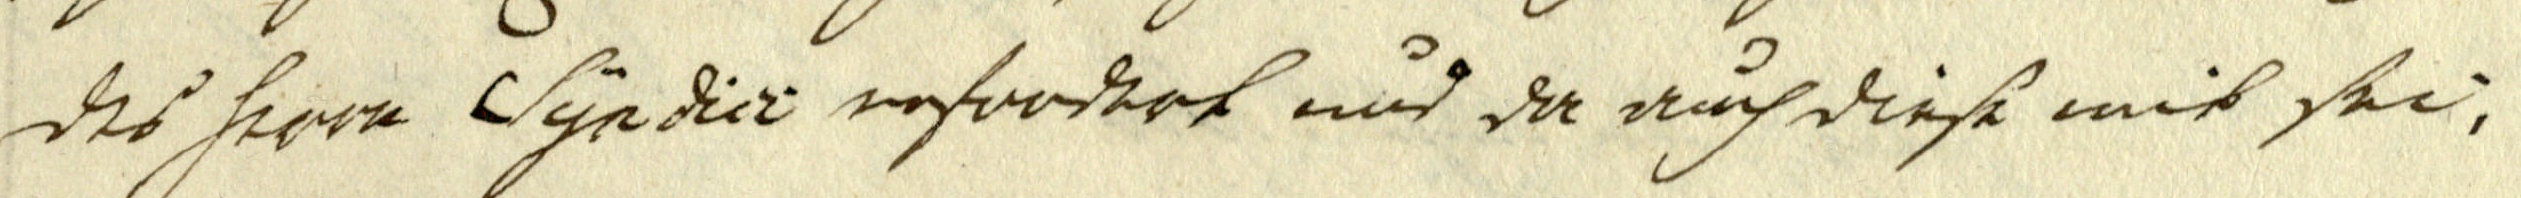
des herrn Sÿndici erfordert und da auch diese mit sei¬
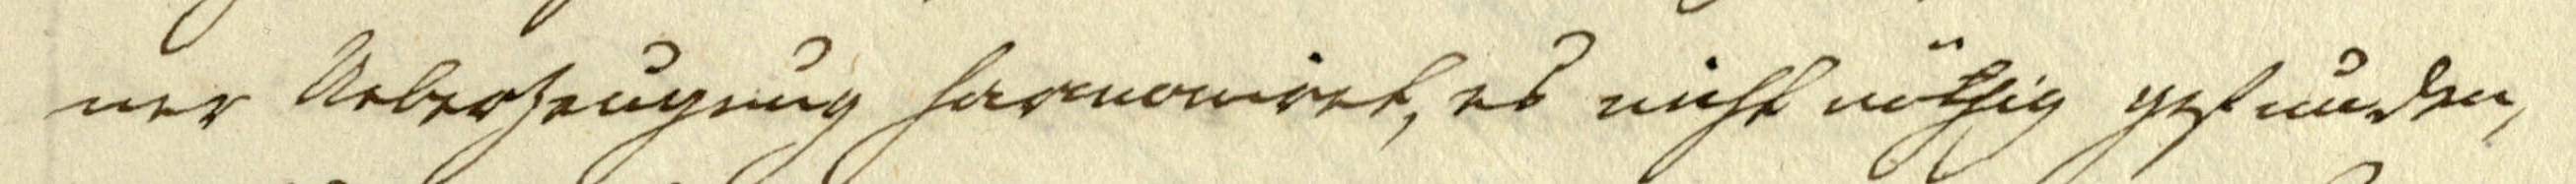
ner Ueberzeugung harmoniret, es nicht nöthig gefunden,
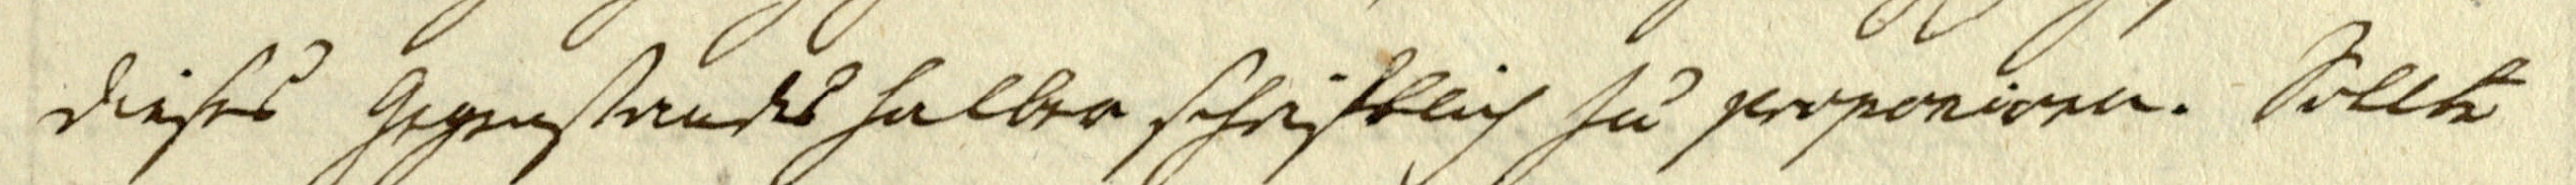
dieses Gegenstandes halber schriftlich zu proponiren. Sollte
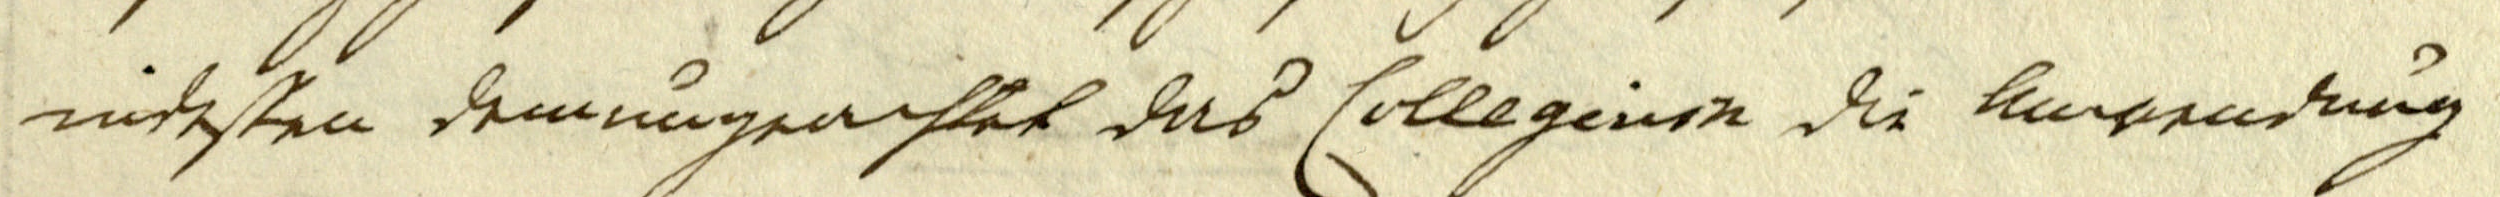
indessen demungeachtet das Collegium die Anwendung
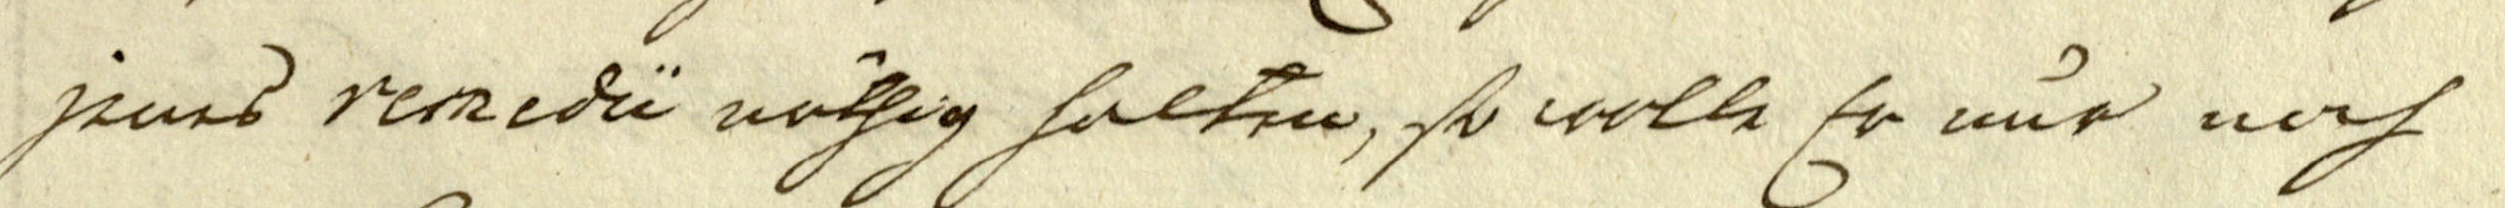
jenes remedii nöthig halten, so wolle Er nur noch
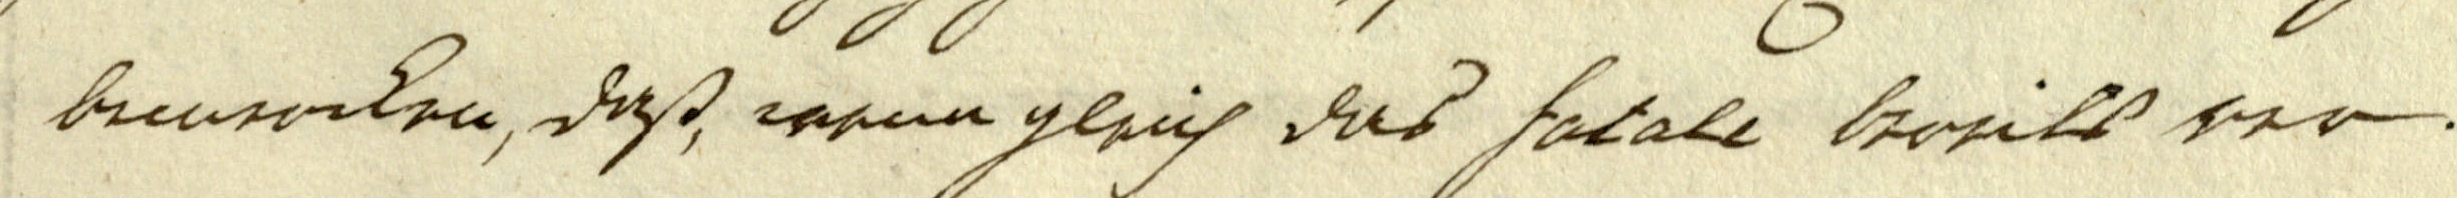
bemercken, daß, wenn wenn gleich das fatale bereits ver¬
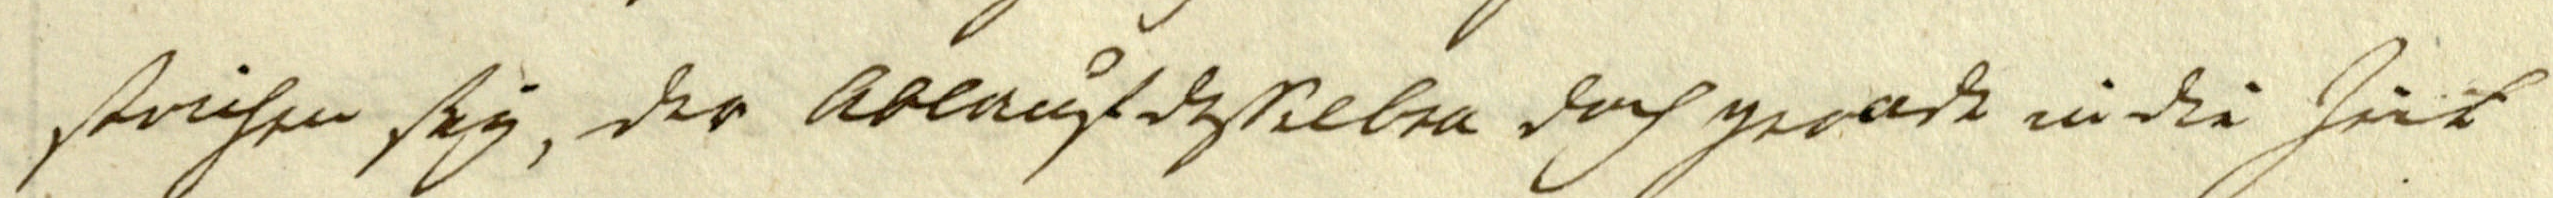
strichen seÿ, der Ablauf desselben doch gerade in die Zeit
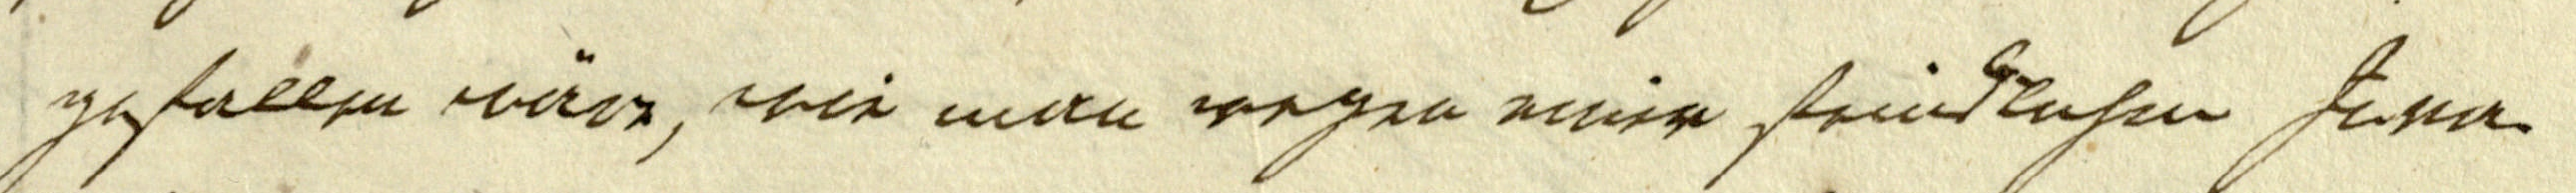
gefallen wäre, wie man wegen einer feindlichen Inva¬
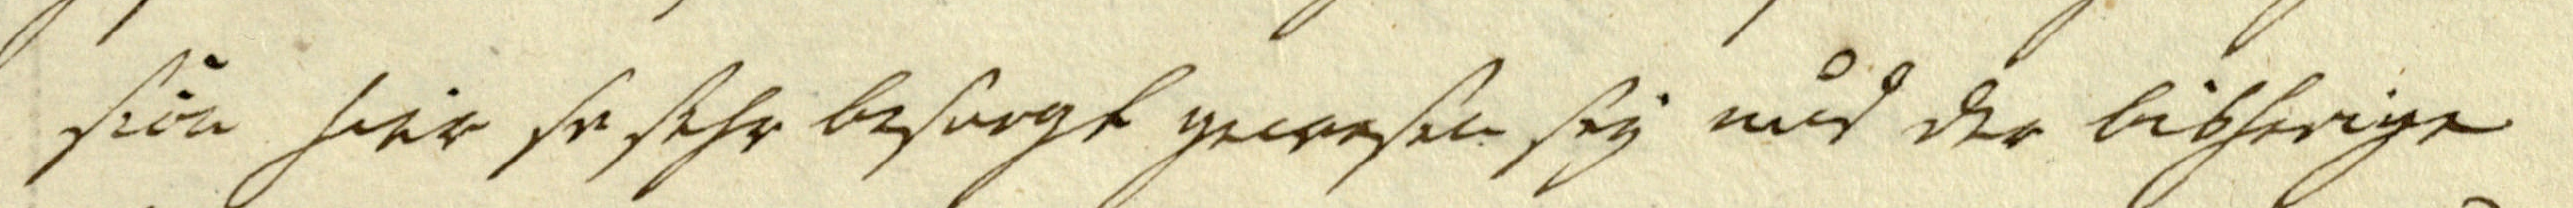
sion hier so sehr besorgt gewesen seÿ und der bisherige
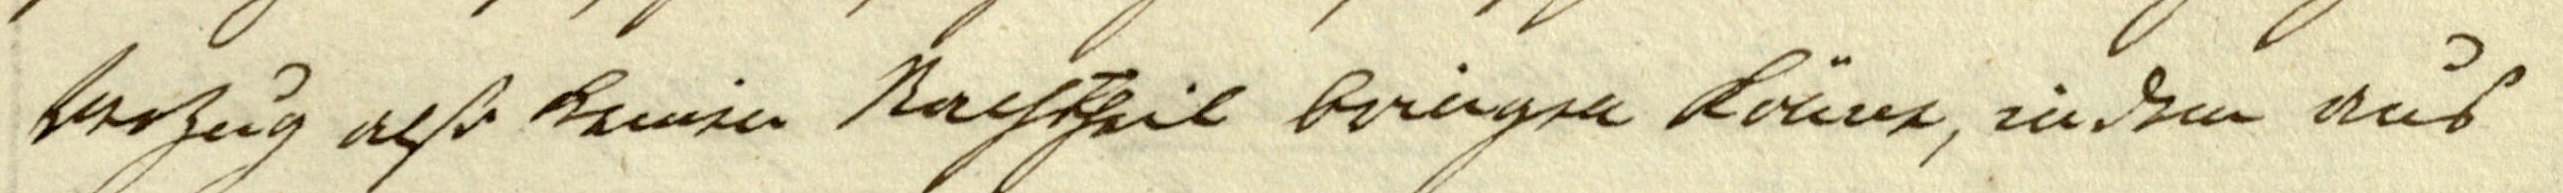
Verzug also keinen Nachtheil bringen könne, indem aus
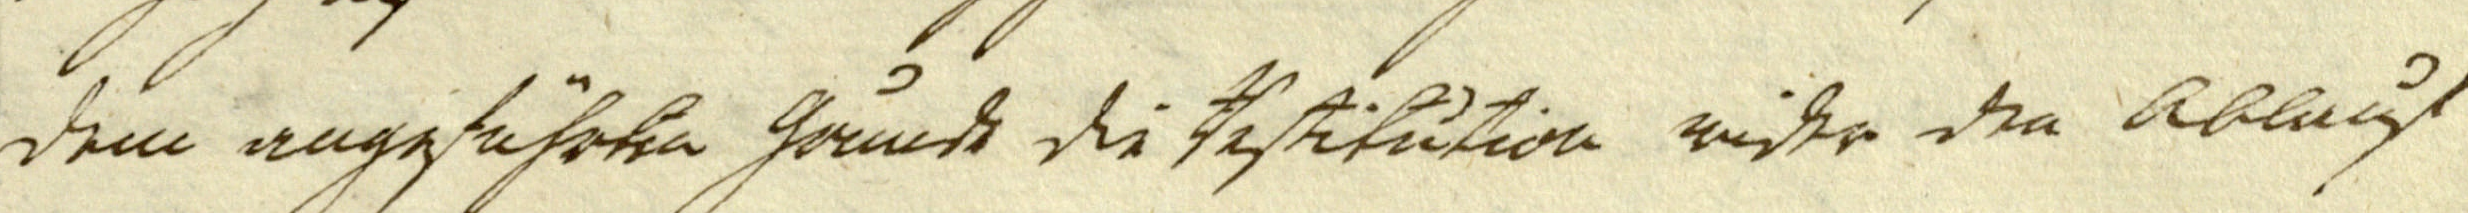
dem angeführten Grunde die Restitution wider den Ablauf
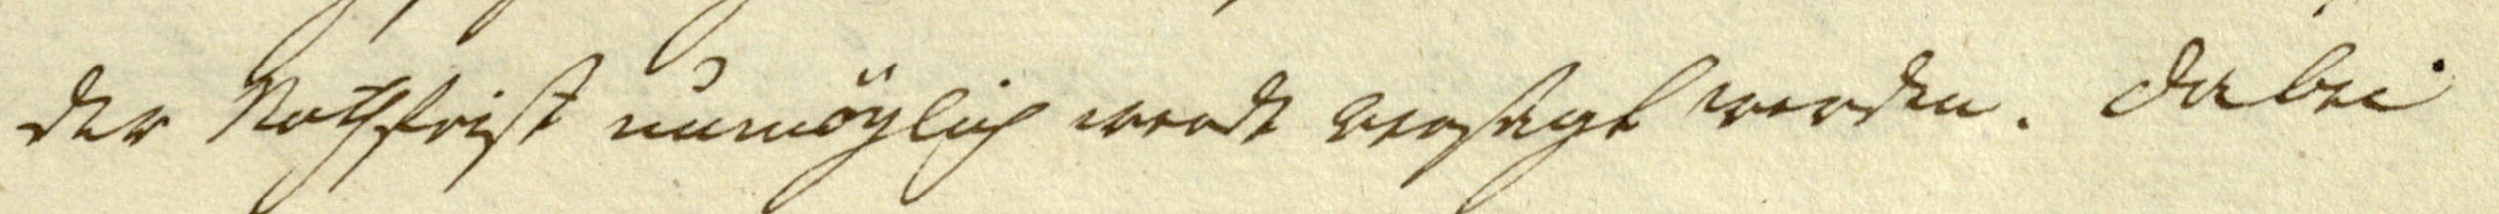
der Nothfrist unmöglich werde versagt werden. Dabei
